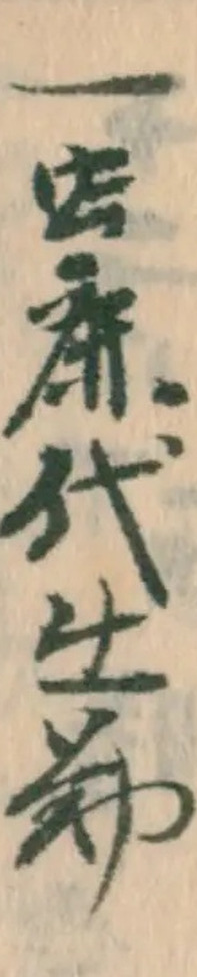一虫鹿代出勤
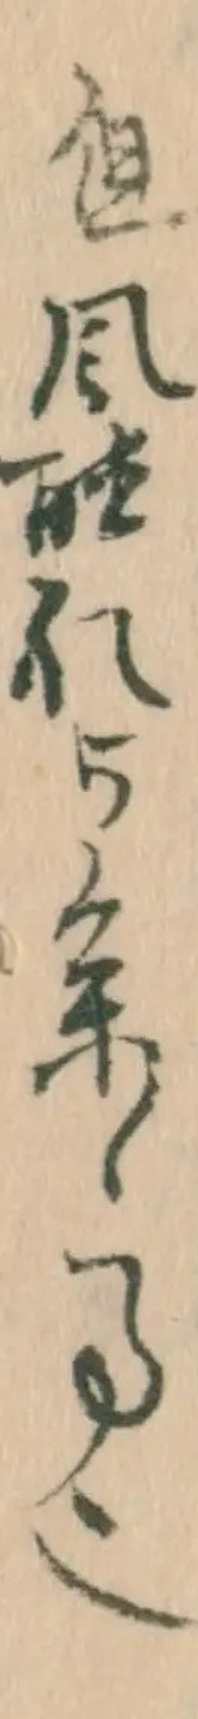但風聴礼被参候事也
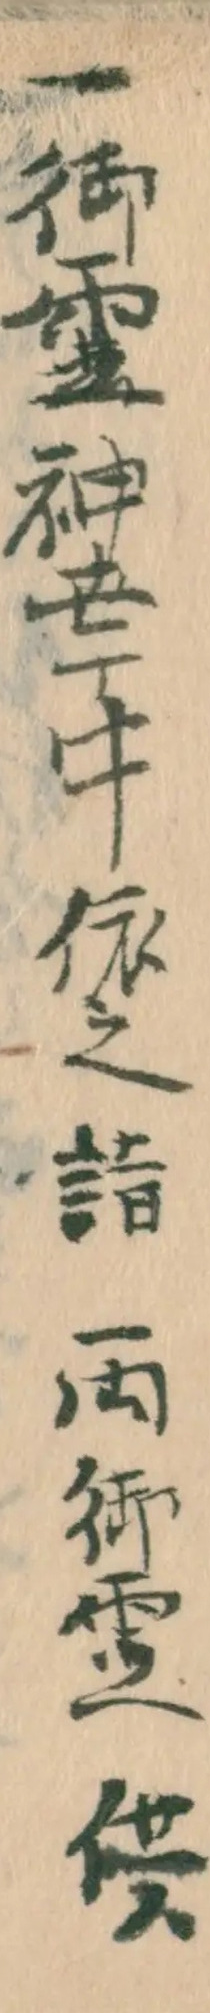一御霊神幸中依之詣両御霊供
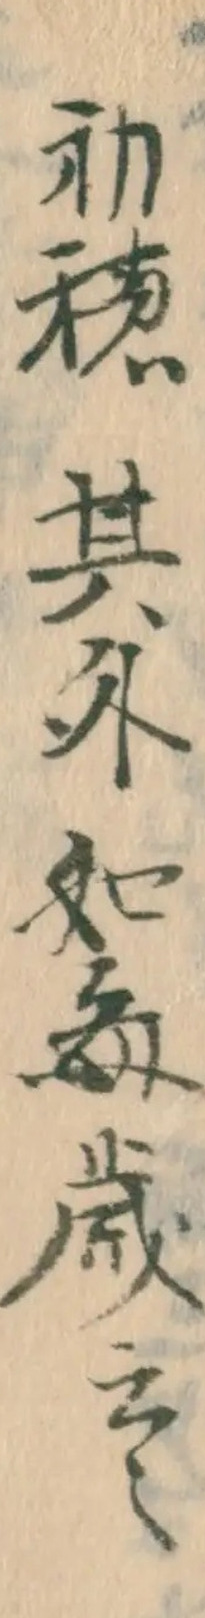初穂其外如毎歳云々

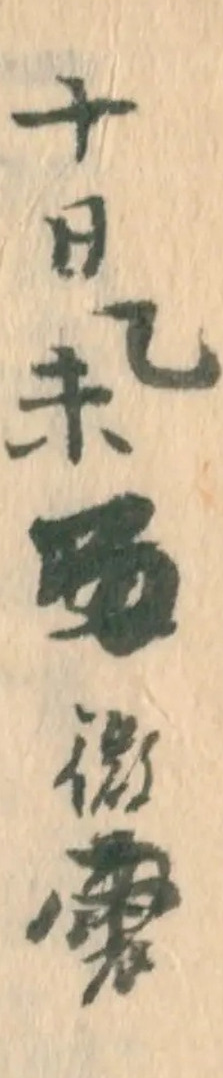十日乙未雨微震
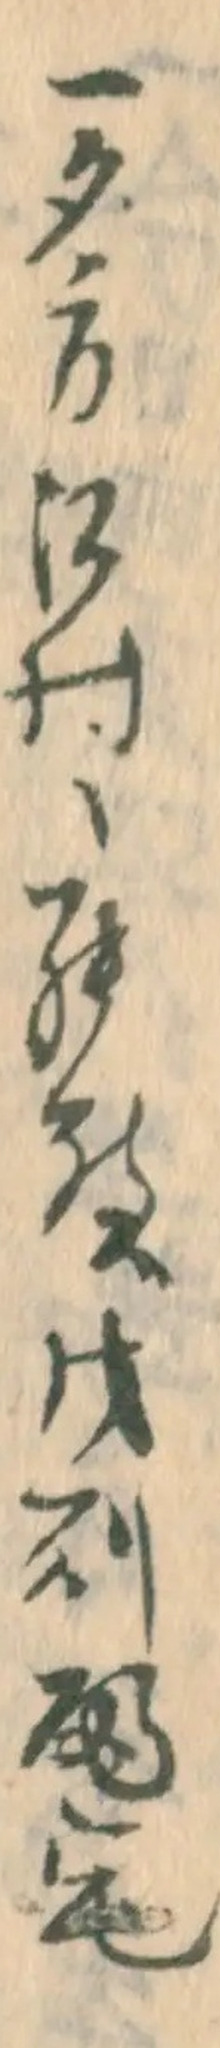一夕方沢村へ罷越ス戌刻帰宅
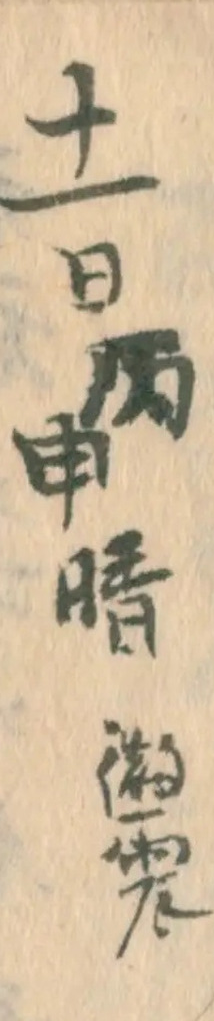十一日丙申晴微震
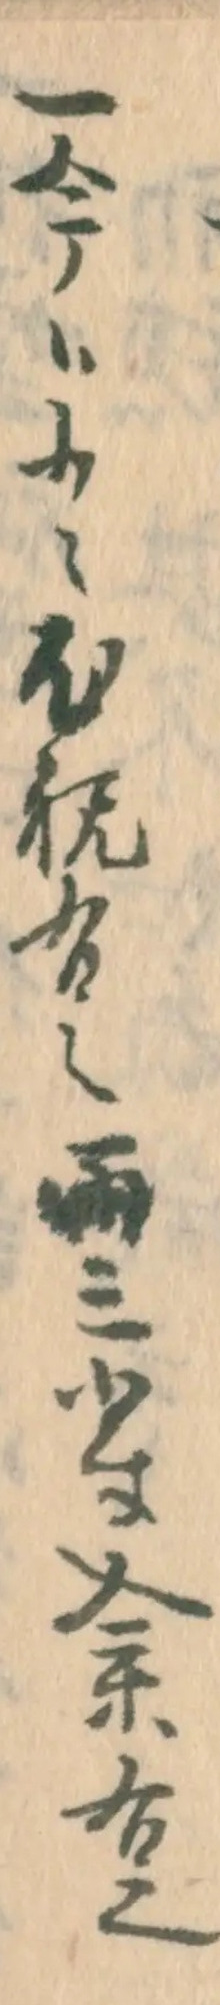一今日少々尤祝有之両三輩入来有之
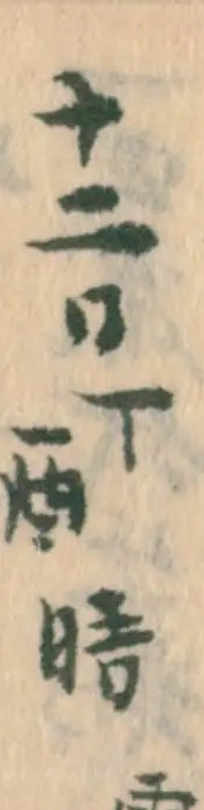十二日丁酉晴震
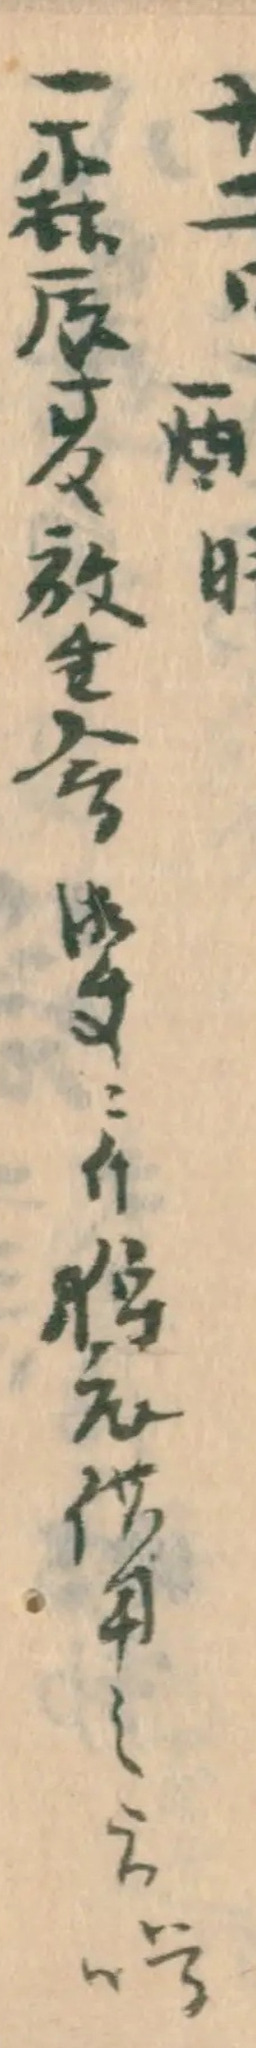一森辰夏放生会御使ニ付狩衣借用之旨噂
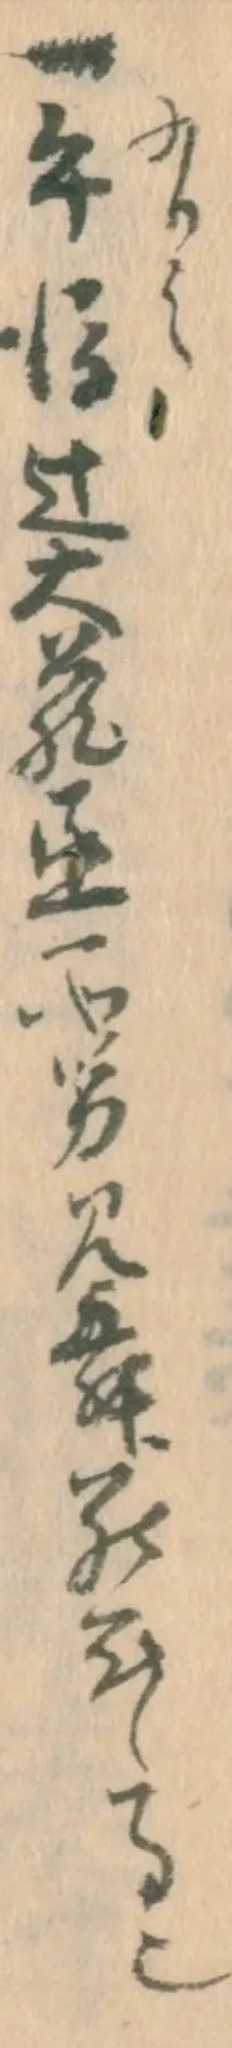一午後辻大蔵丞所労見舞罷越候事也
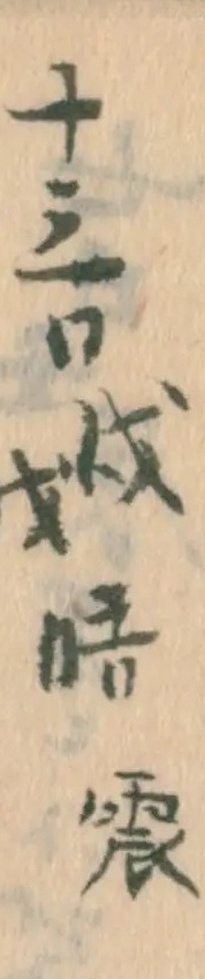十三日戊戌晴震
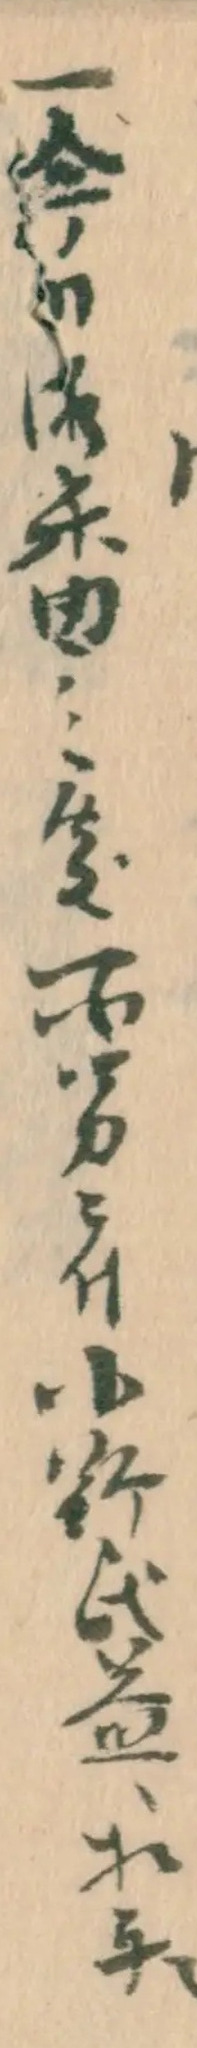一今日御番之処所労ニ付小野氏益へ相頼
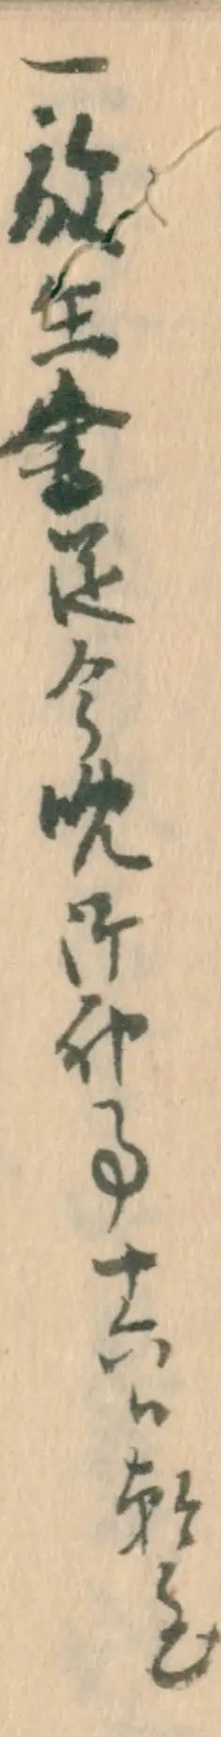一放生会従今晩御神事十六日朝迄
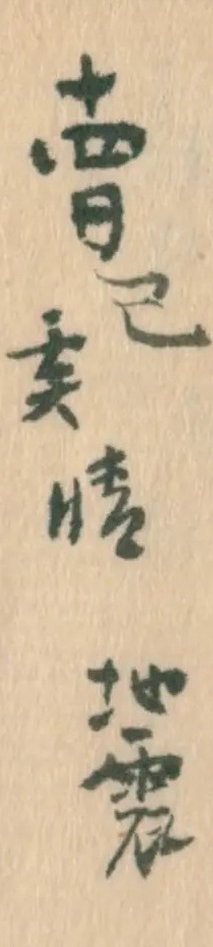十四日己亥晴地震
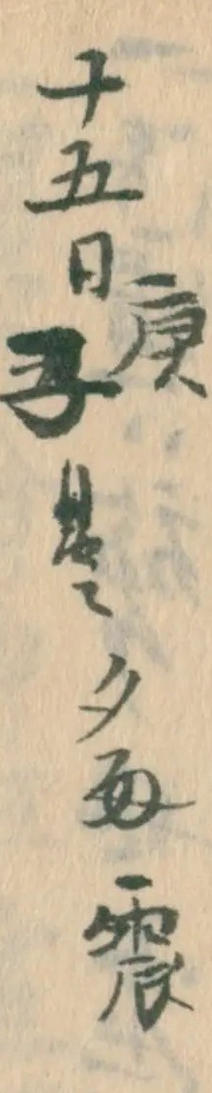十五日庚子曇夕雨震
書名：禁裏御所御用日記. [131]
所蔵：国立国会図書館 National Diet Library, JAPAN
